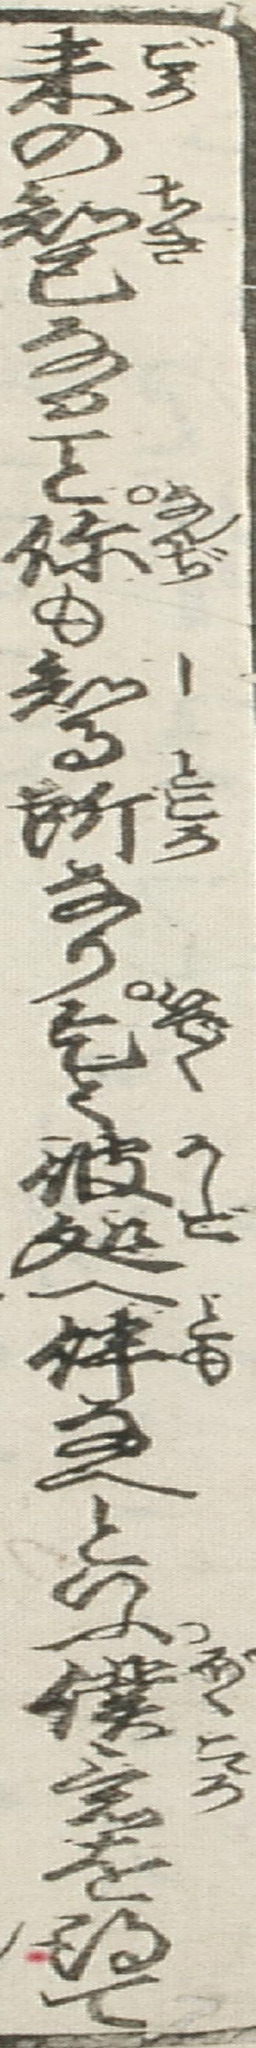来の知己なること。你も知る所なり。乞々彼処へ伴なへといふ。僕意を得て
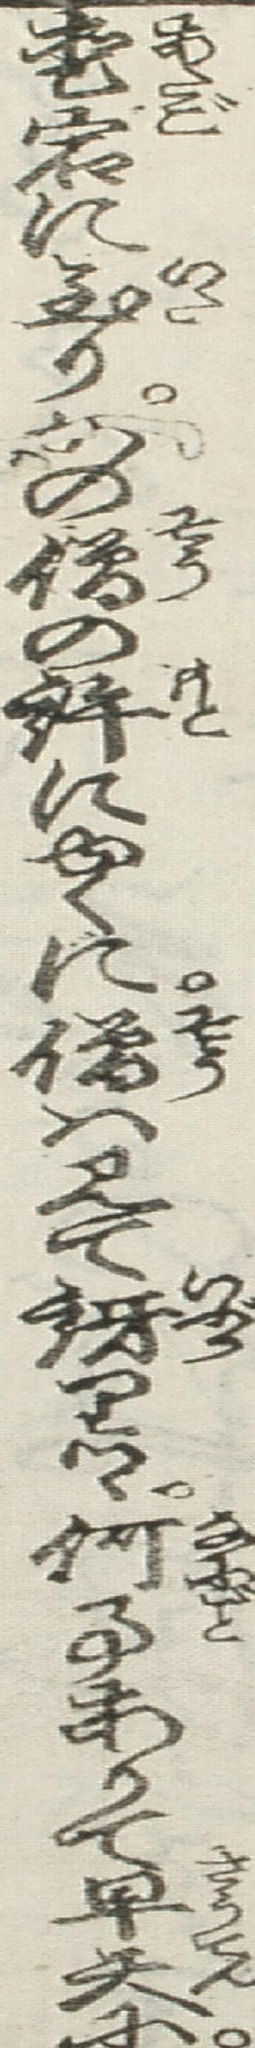愛宕に至り。かの僧の許にゆくに。僧は見て訝りつゝ。何事ありて早天に。
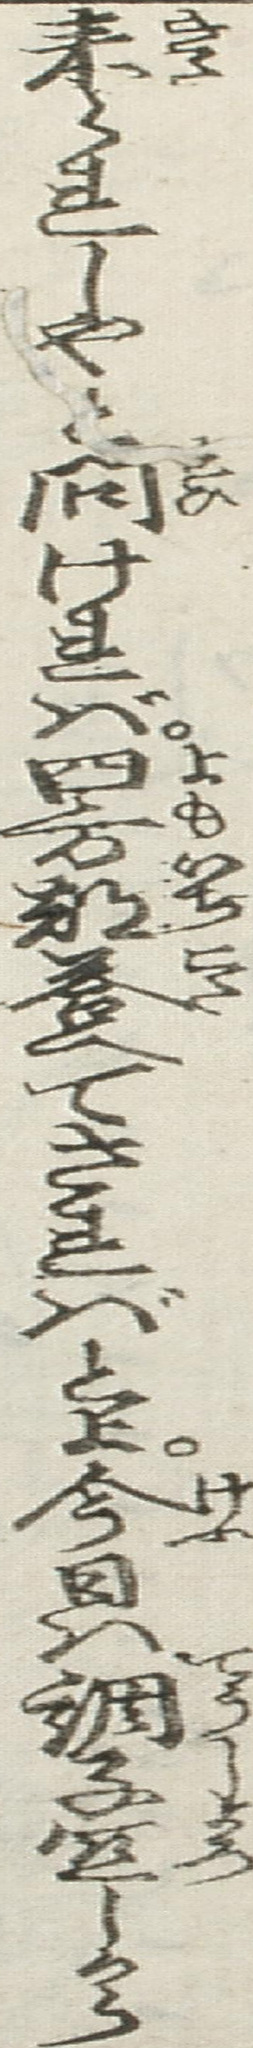来られしやと問ければ。四方都答へてさればとよ。今日は調子宜しから
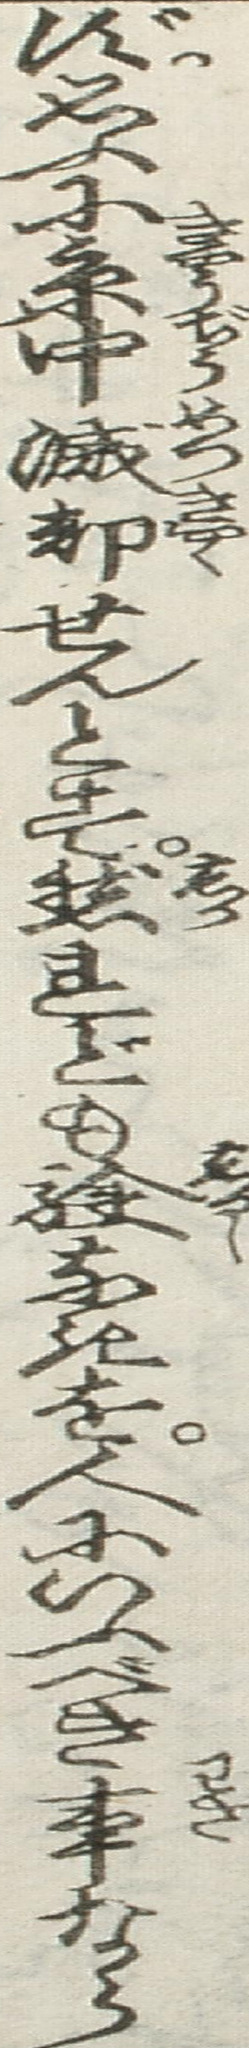ず。思ふに京中滅却せんとす。然れども験なきを。人にいふべき事なら
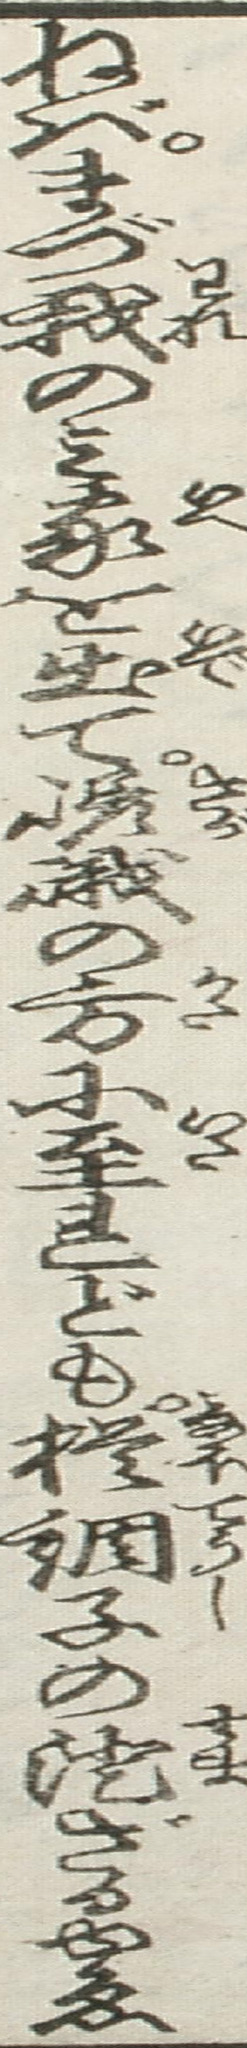ねば。まづ我のみ家を出て。嵯峨の方に至れども。猶調子の澄ざるゆゑ
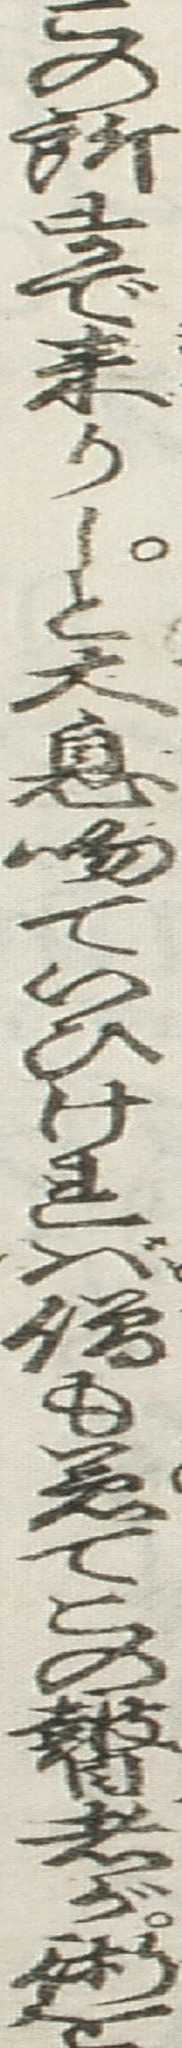この所まで来りし。と大息吻ていひければ。僧も兼てこの瞽者が。術を
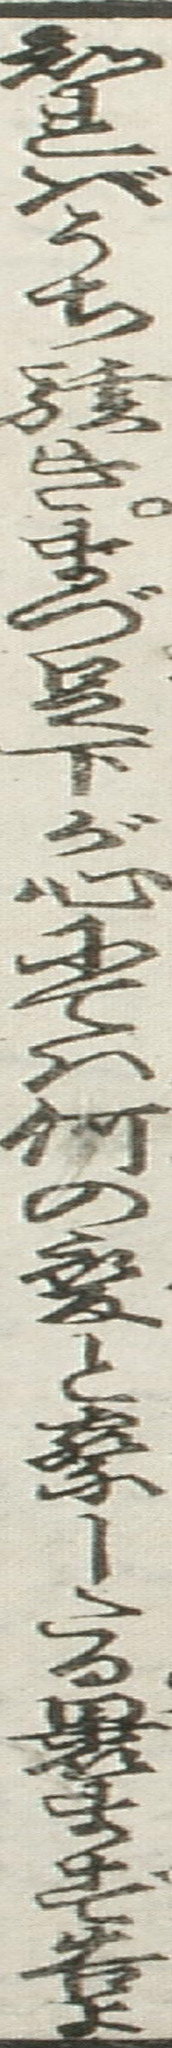知ればうち駭き。まづ足下が心にては。何の変と察したる。裹まず告よ
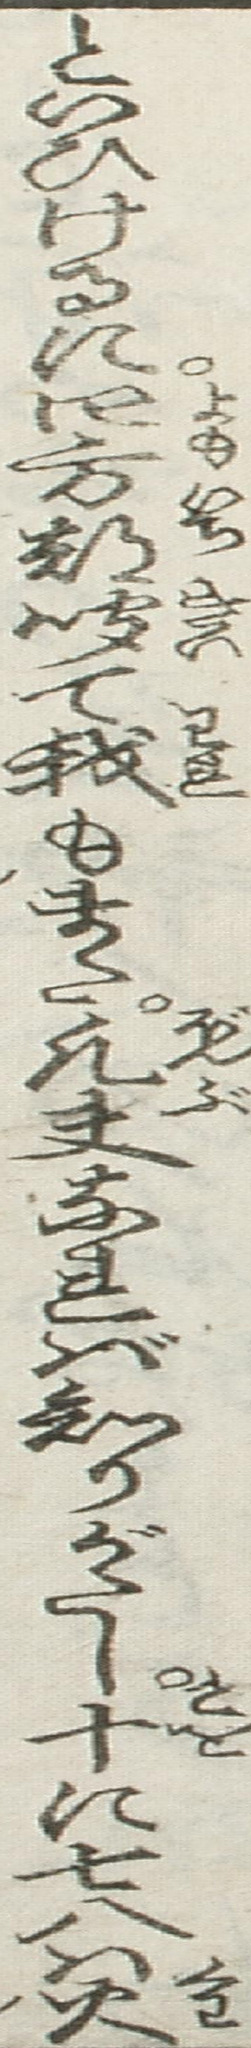といひけるに。四方都聞て我もまた。凡夫なれば知りがたし。十に七八は火
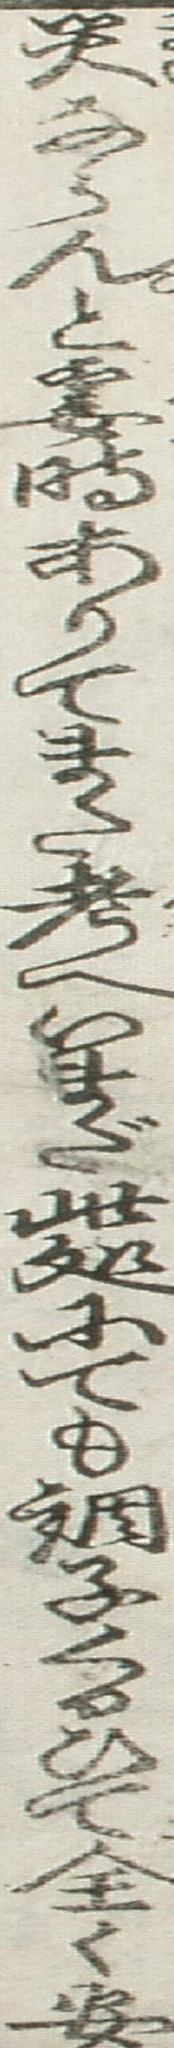災ならん。と霎時ありてまた考へ。いまだ此処にても調子くるひて。全く安
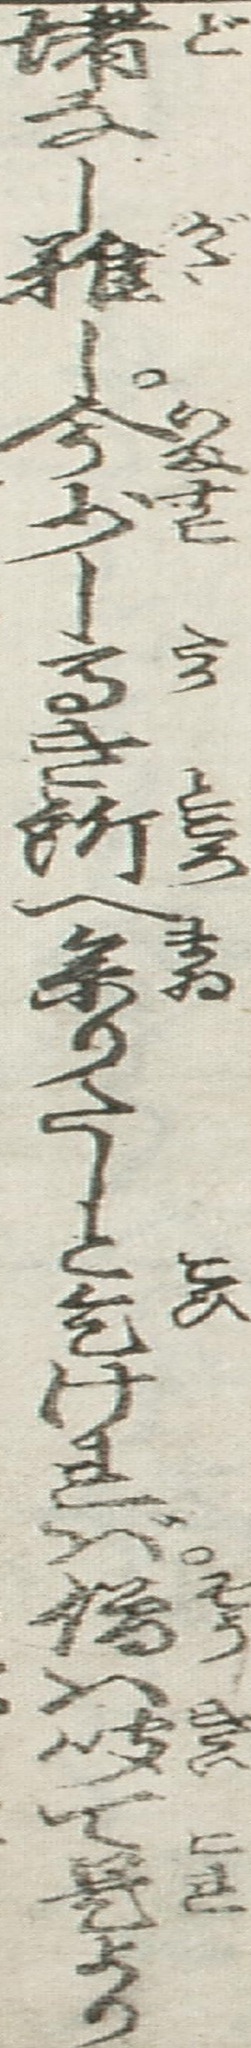堵なし難し。今少し高き所へ参りたしと乞ければ。僧は聞て是より
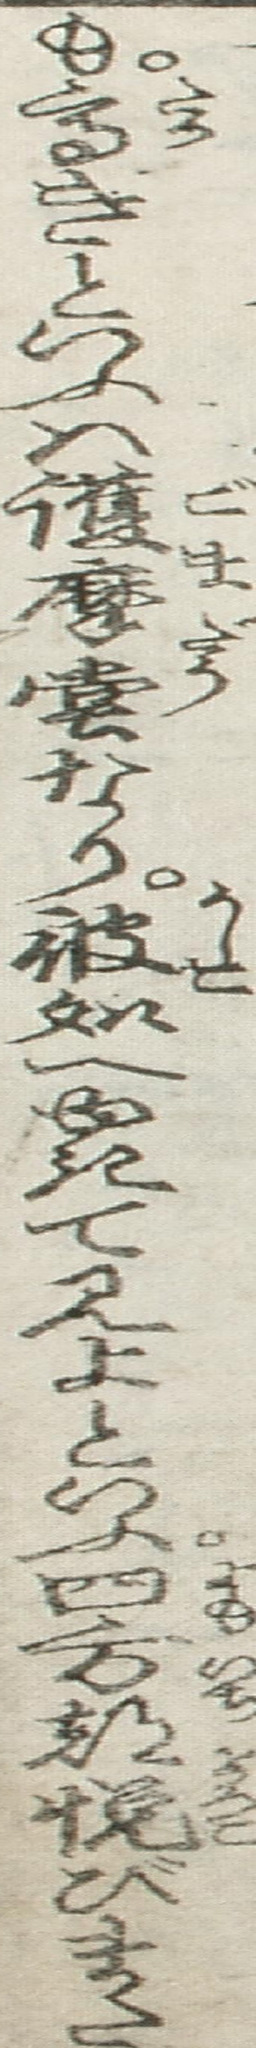も。高きといふは護摩堂なり。彼処へゆきて見よといふ。四方都悦びまた

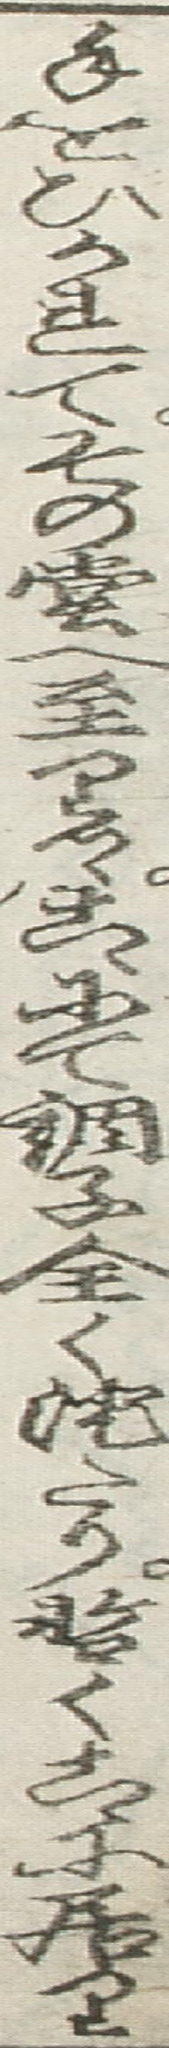手をひかれて。その堂へいたりツゝ。こゝにて調子全く澄たり。暫くこゝに居り
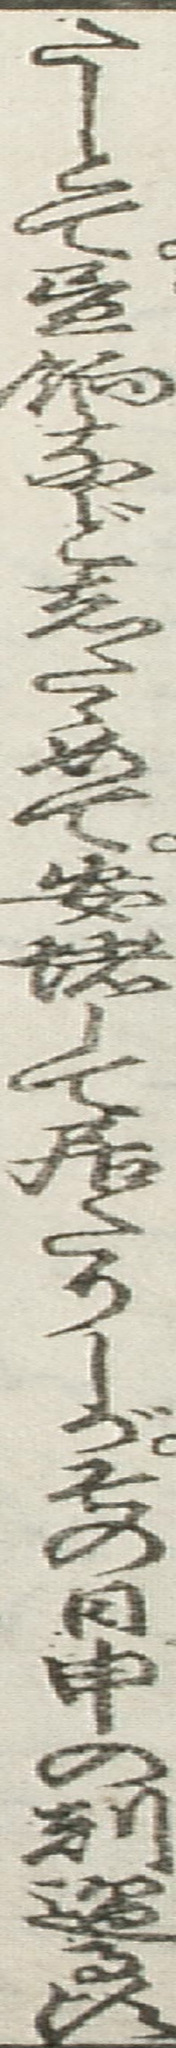たしとて。昼餉などしたゝめて。安堵して居たりしが。その日申の刻過る頃
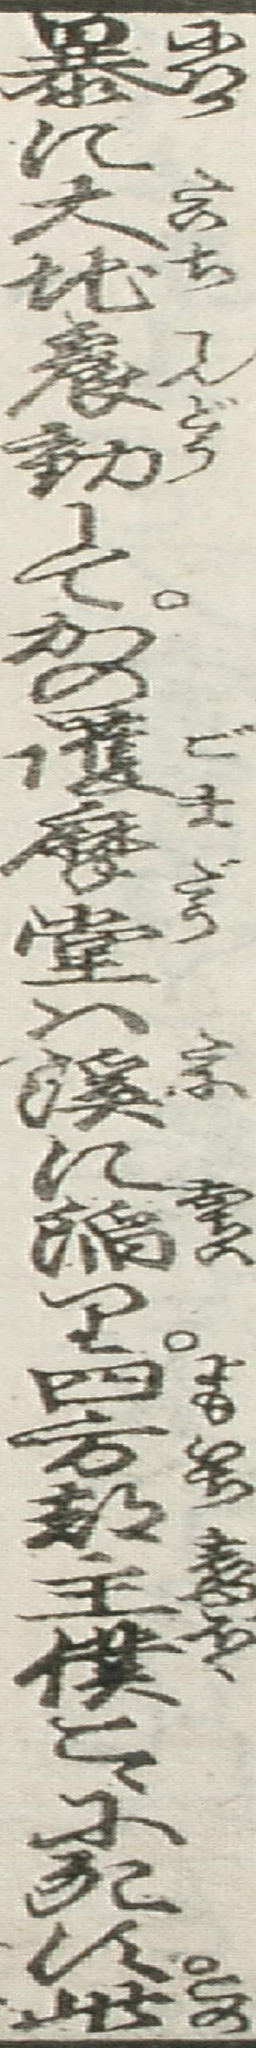暴に大地震動して。かの護摩堂は渓に陥り。四方都主僕こゝに死す。此
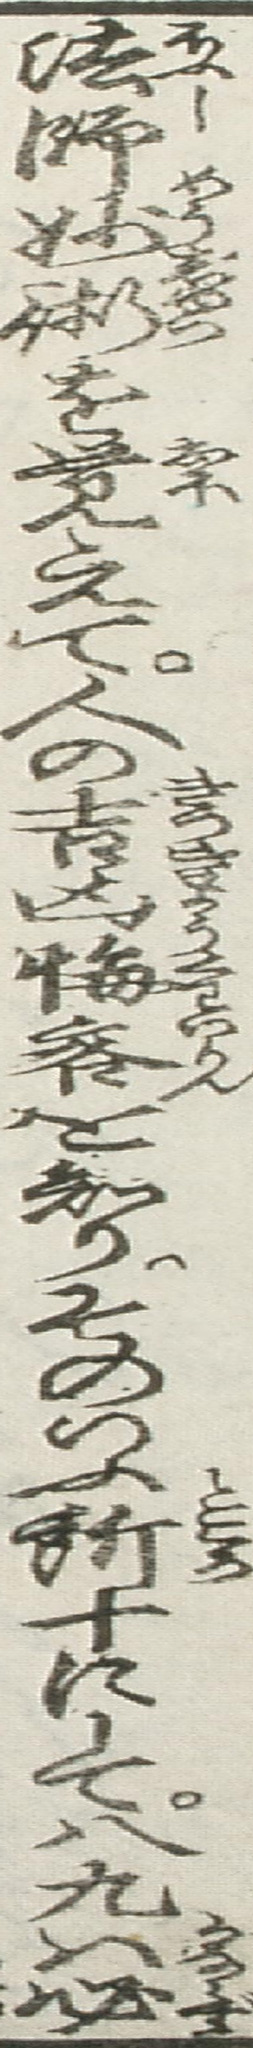法師妙術を覚えて。人の吉凶悔吝を知り。そのいふ所十にして。八九は必
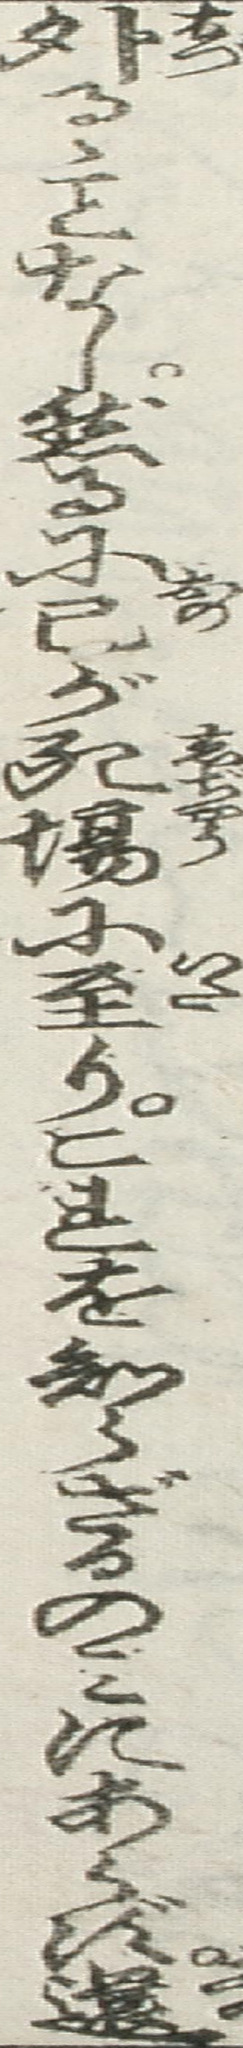外るゝことなし。然るに己が死場に至り。これを知らざるのみにあらず。還
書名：安政見聞録　下
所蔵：東京大学地震研究所図書室 Earthquake Research Institute Library, The University of Tokyo, JAPAN
